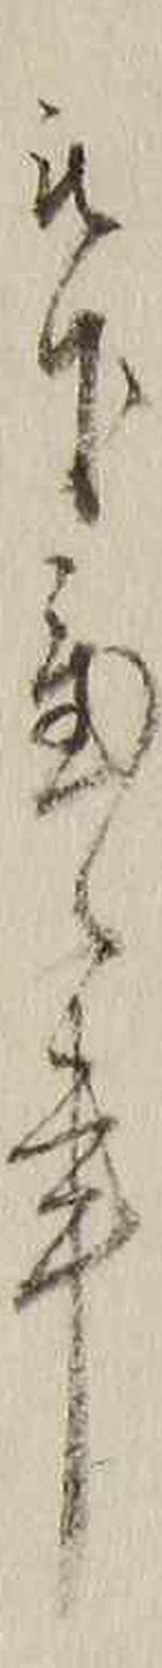被下置候事
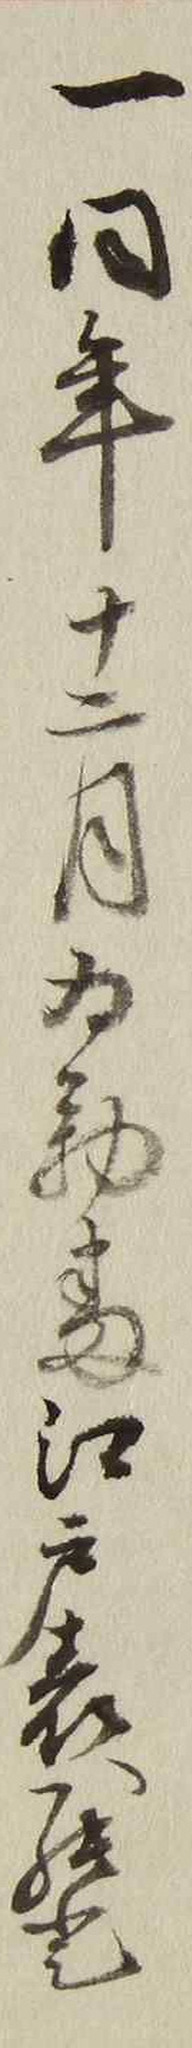一同年十二月為勤番江戸表へ罷登
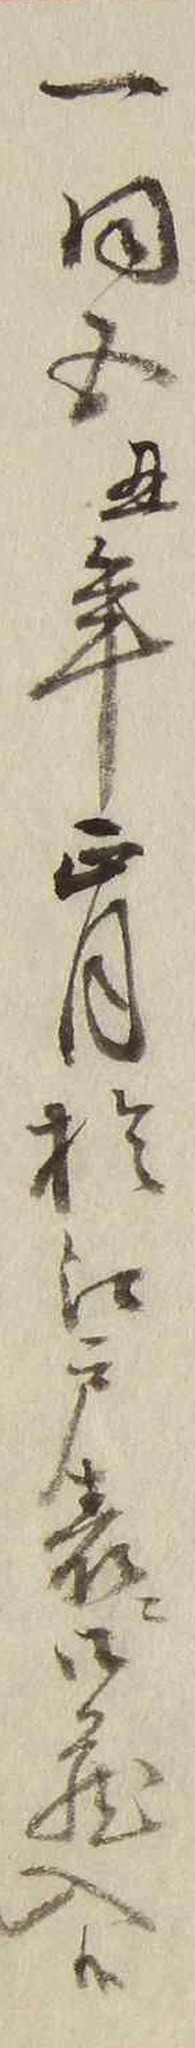一同五丑年正月於江戸表ニ候御蔵入候

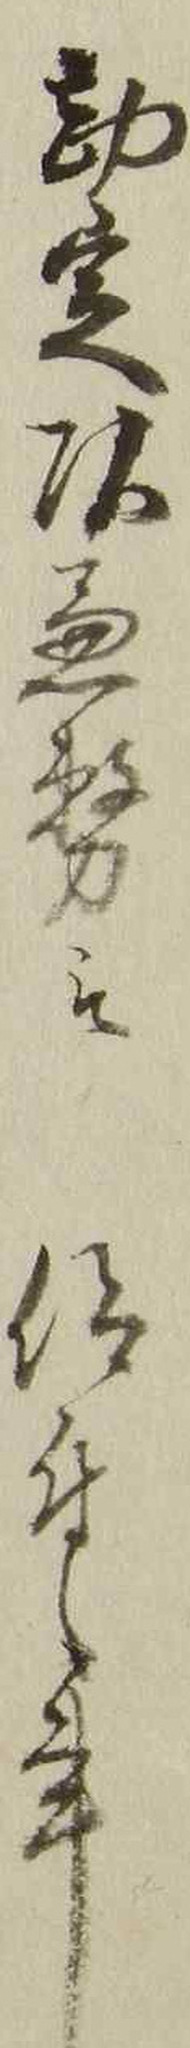勘定頭兼務被仰付候事
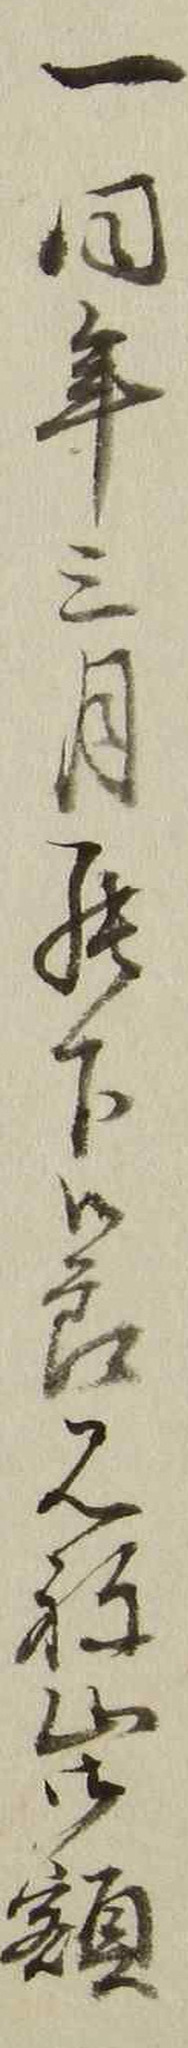一同年三月罷下候節見禰山御額
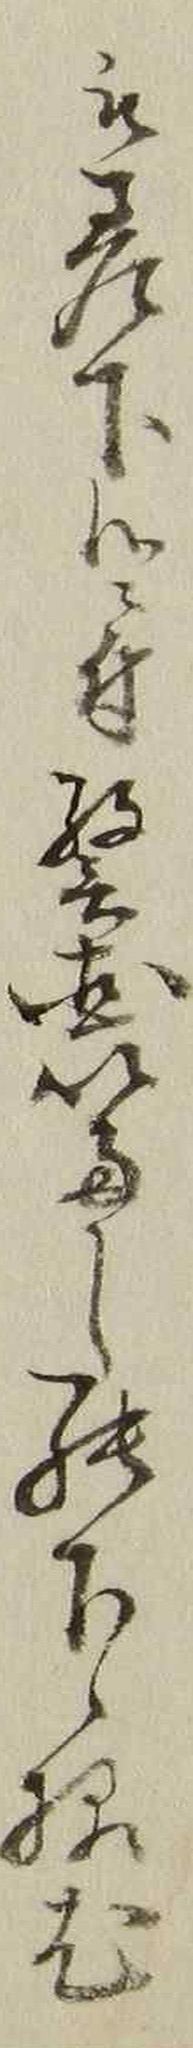被差下候ニ付警固いたし罷下候様尤
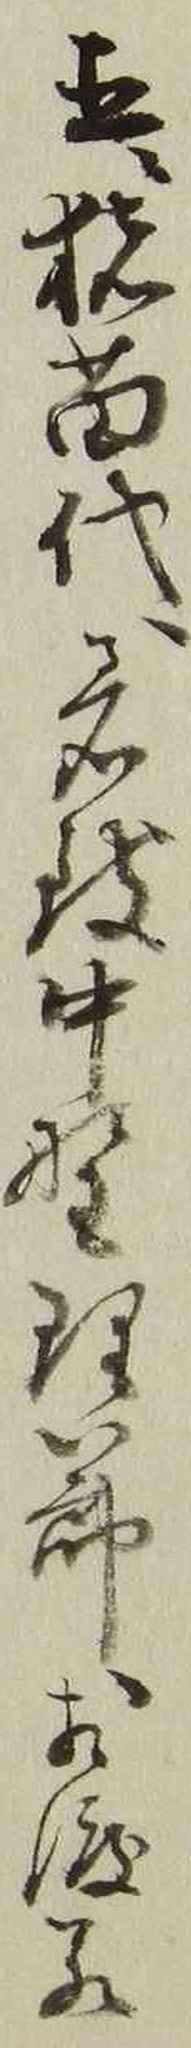直ニ猪苗代へ着致中野理八郎へ相渡若
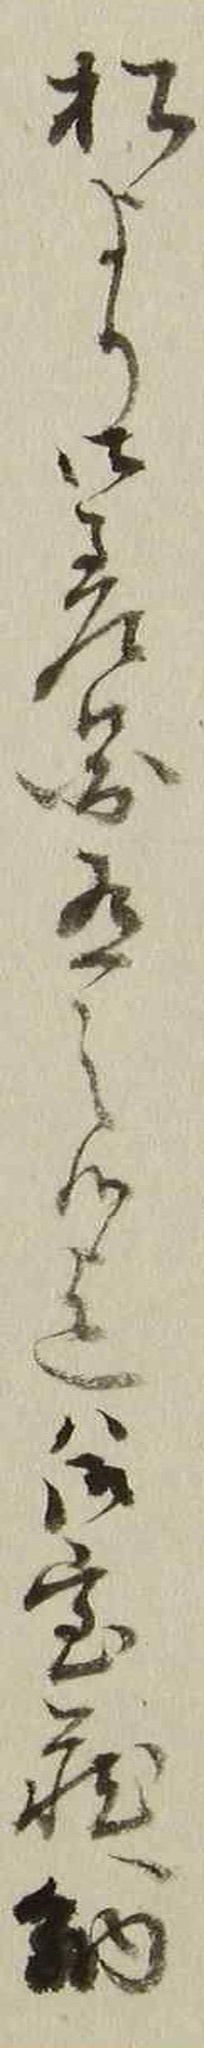松より御差図有之候迄ハ御宝蔵へ納
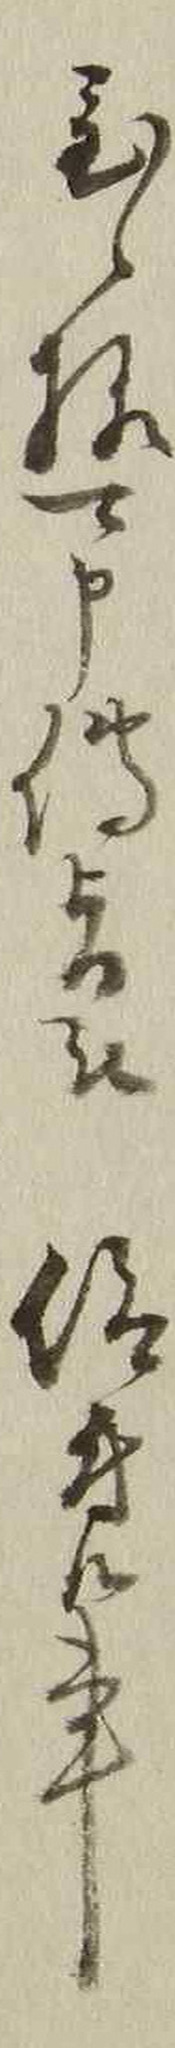置候様可申伝旨被仰付候事
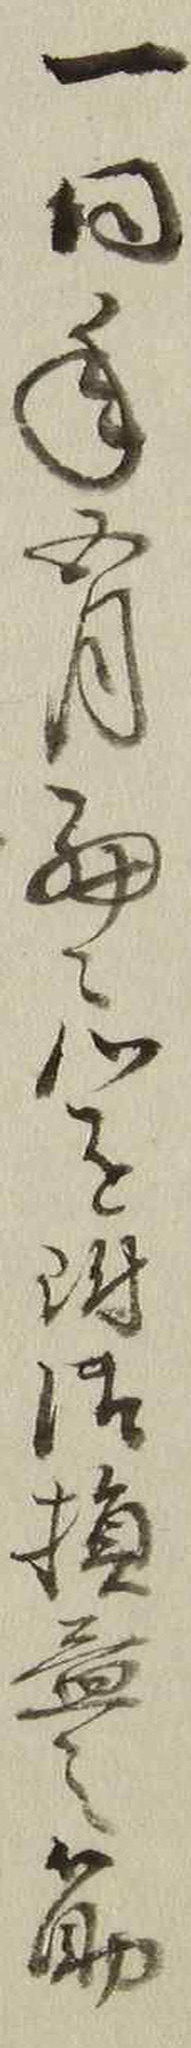一同年五月細々心を附御損益之筋
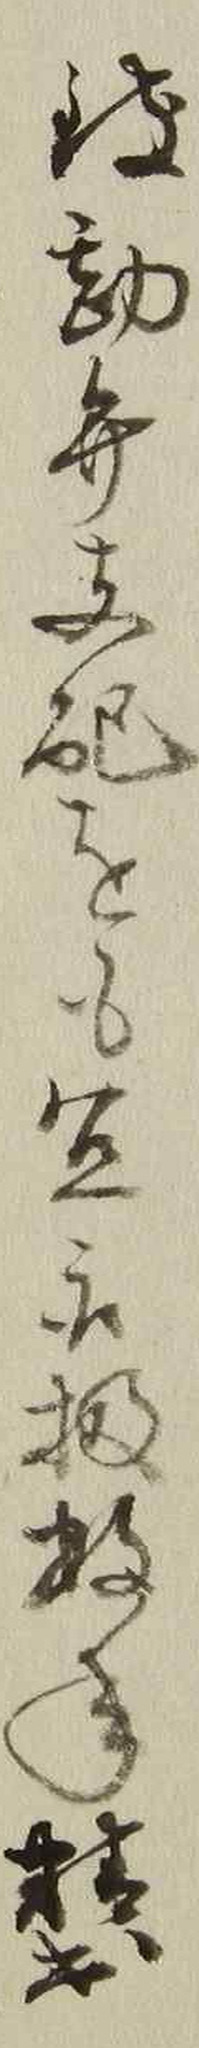致勘弁支配をも宜取扱数年精出
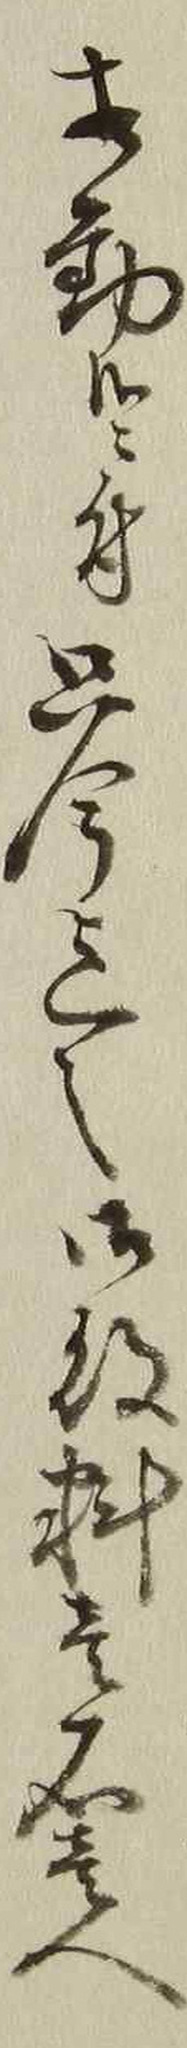相勤候ニ付只今迄之御役料壱石壱人
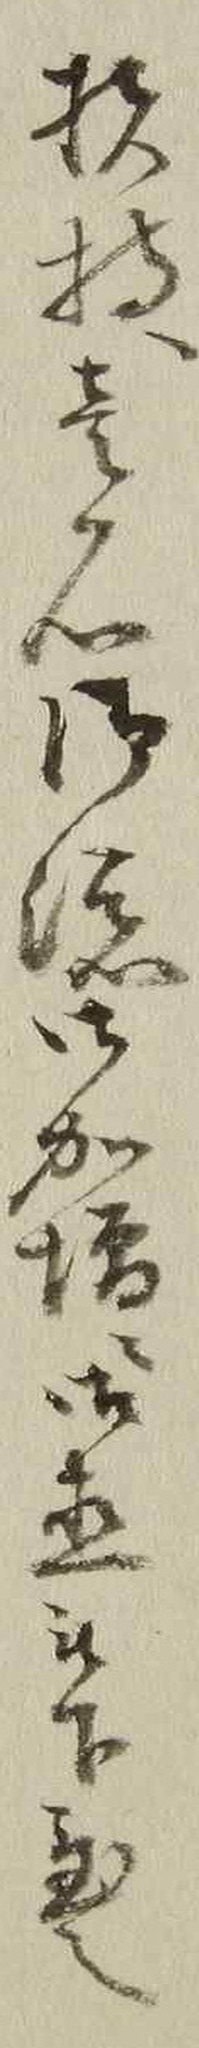扶持へ壱石御添御加増ニ御直被下置之
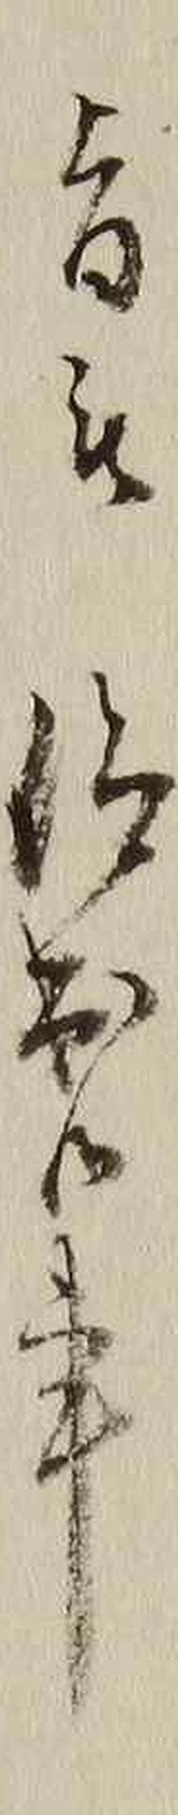旨被仰出候事
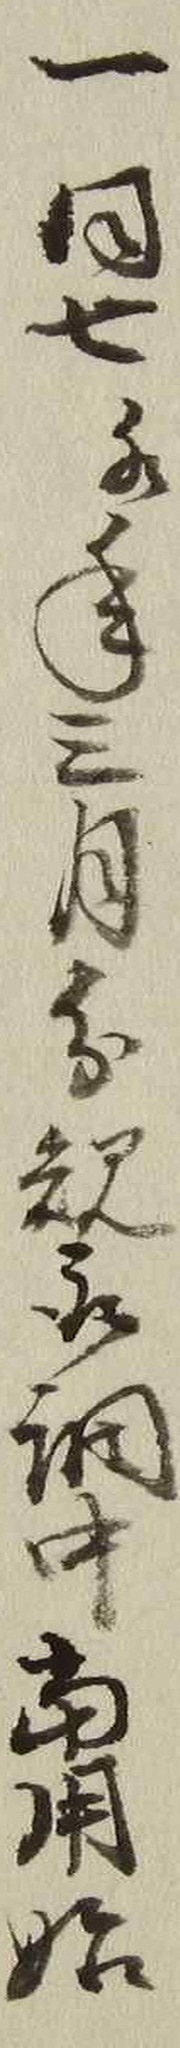一同七卯年三月分規取調中当用始
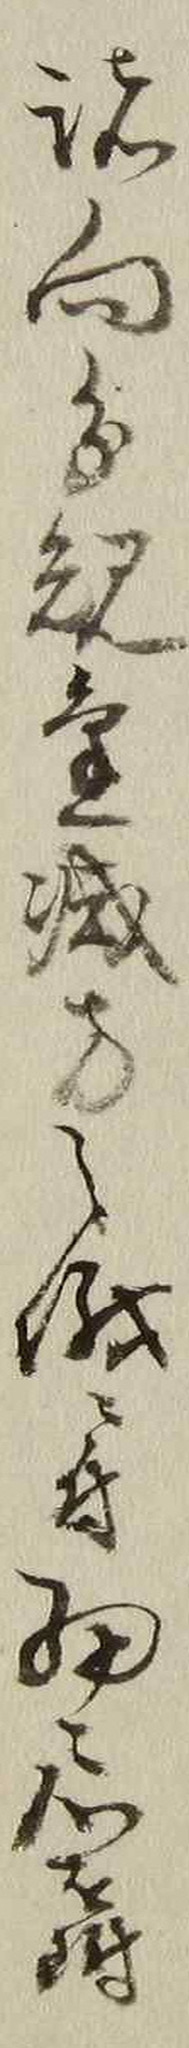諸向分規金減方之儀ニ付細々心を附
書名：諸士系譜　巻之36　は之部4
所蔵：会津若松市立会津図書館
